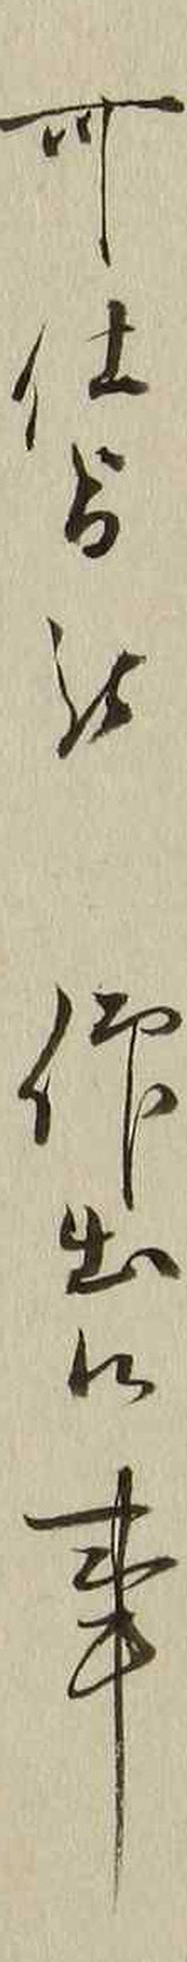可仕旨被仰出候事
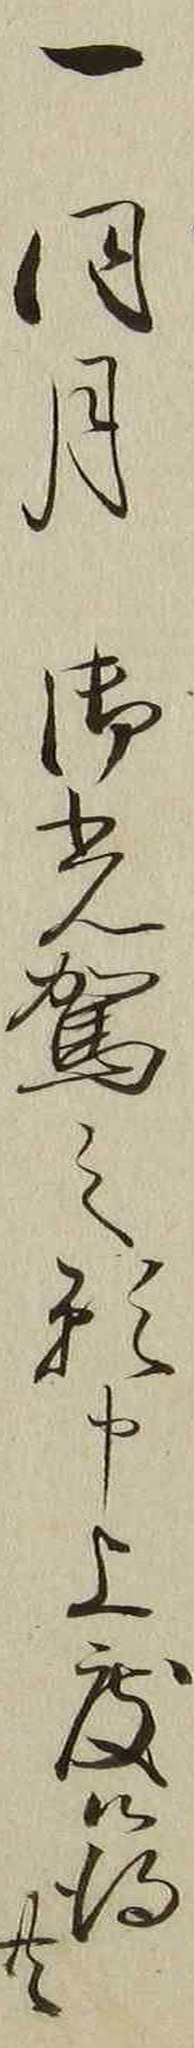一同月御光駕之願申上度候得共
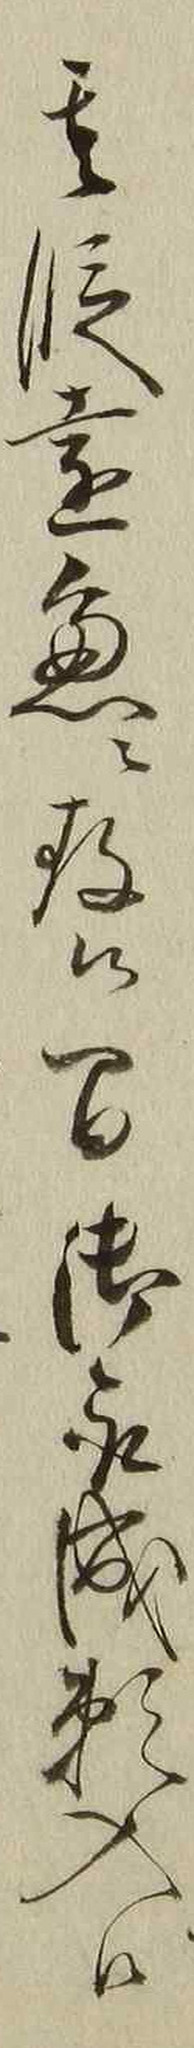其段遠慮に存候間御取成頼入候
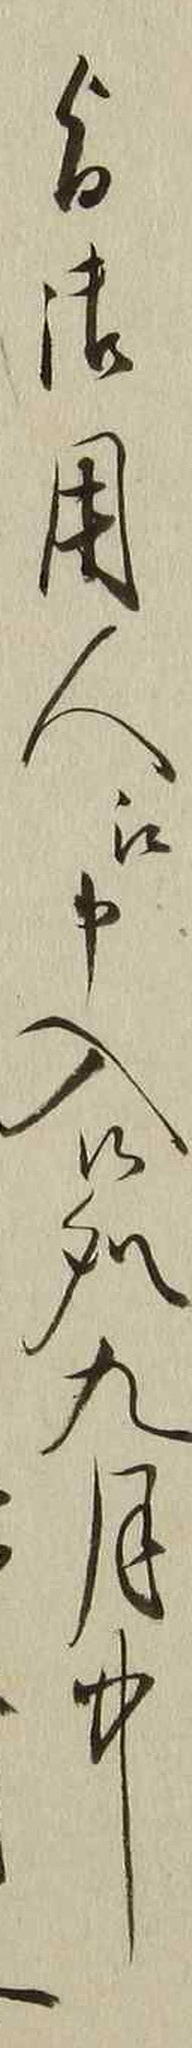旨御用人江申入候処九月中
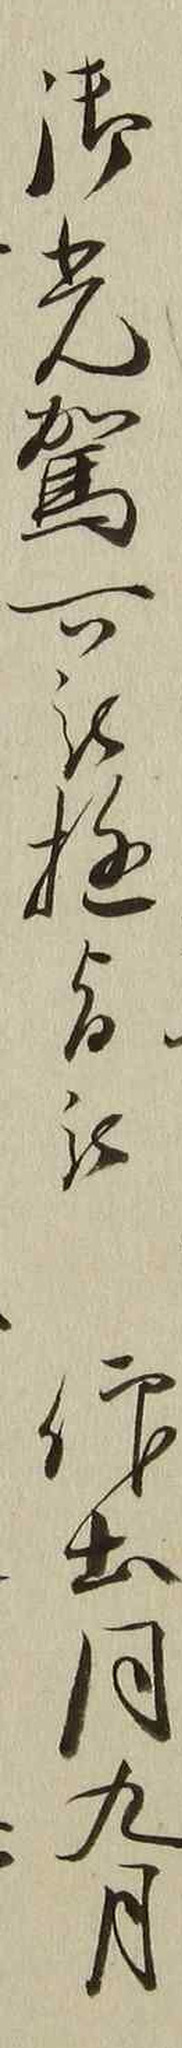御光駕可被遊旨被仰出同九月
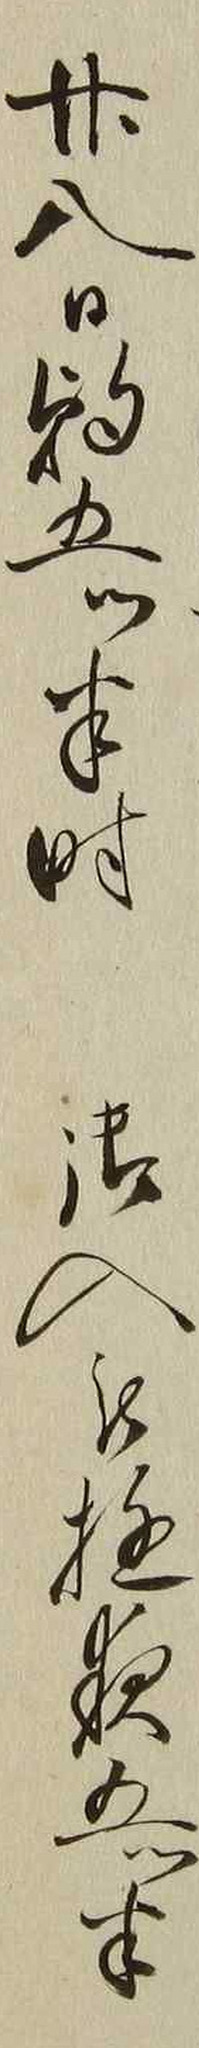廿八日朝五ッ半時御入被遊夜五ッ半
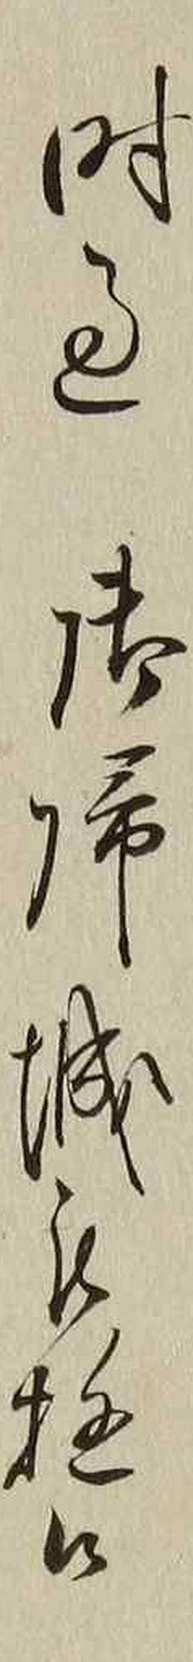時過御帰城被遊候
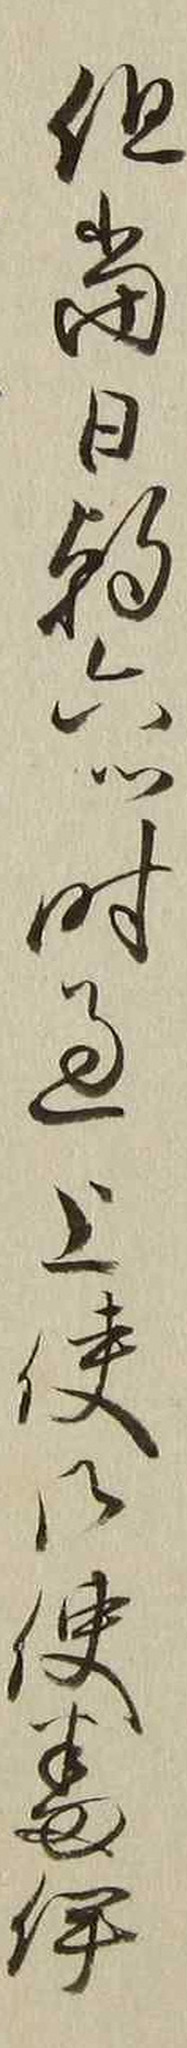但当日朝六ッ時過上使御使番伊
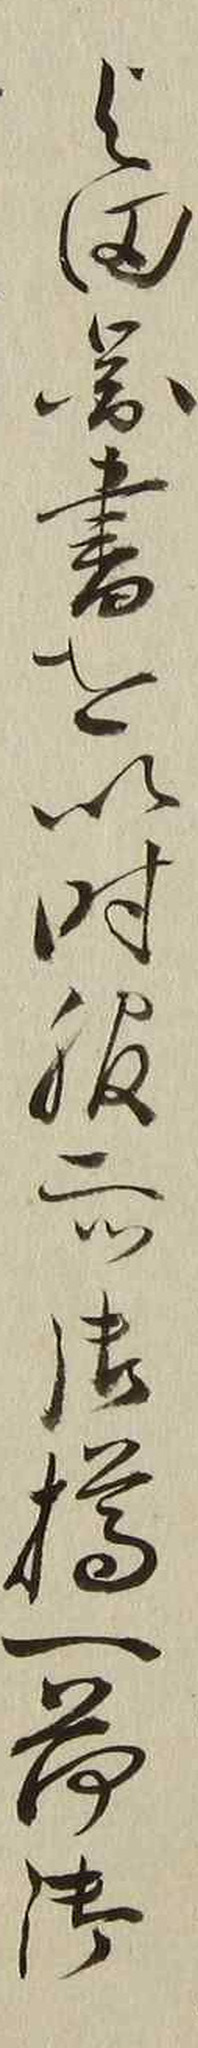与田図書を以時服二つ御樽一荷御
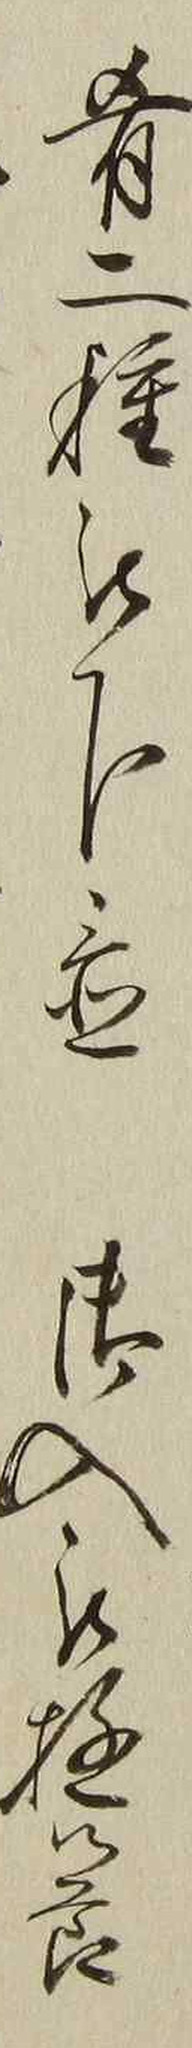肴二種被下置御入被遊候節
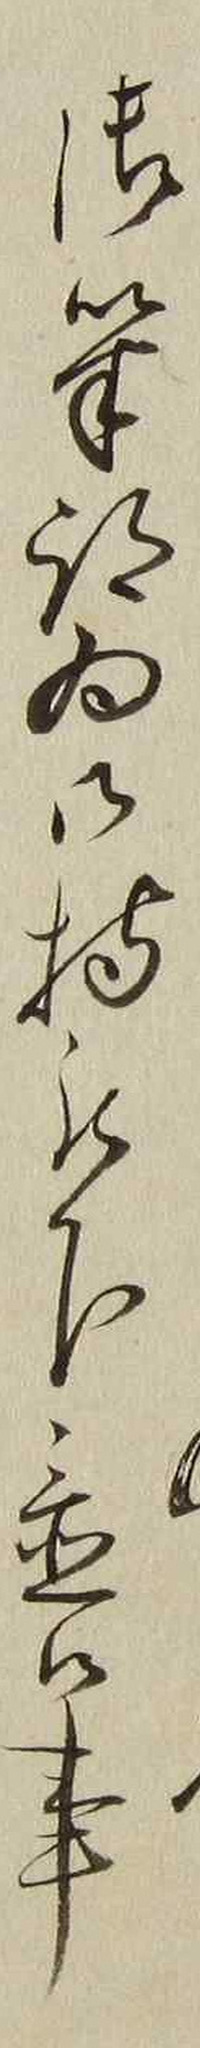御筆跡為御持被下置候事
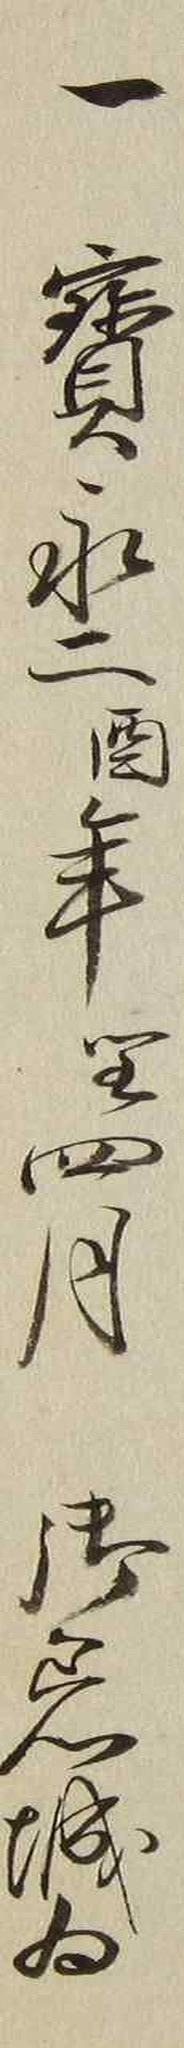一宝永二酉年閏四月御着城為
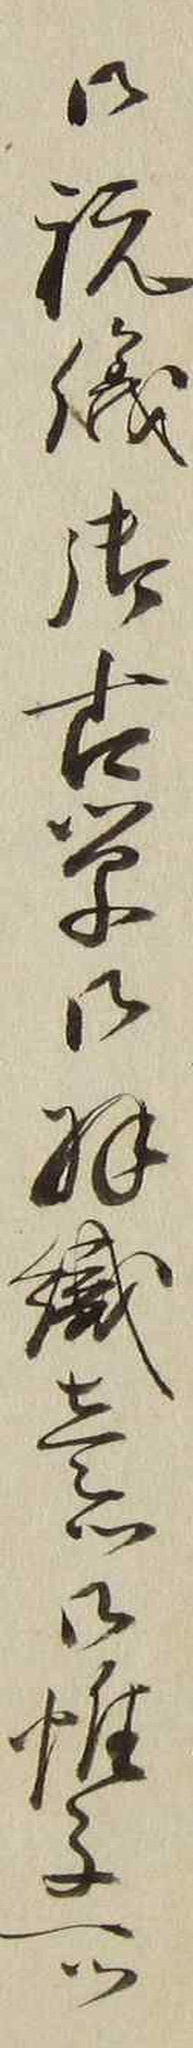御祝儀御古単御羽織壱つ御帷子一つ
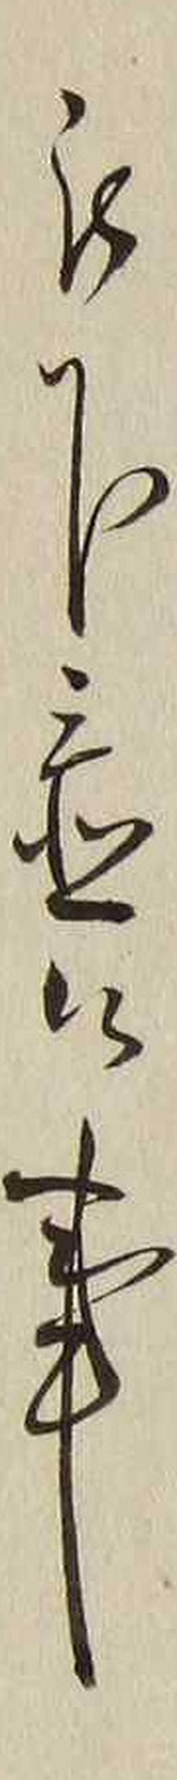被下置候事
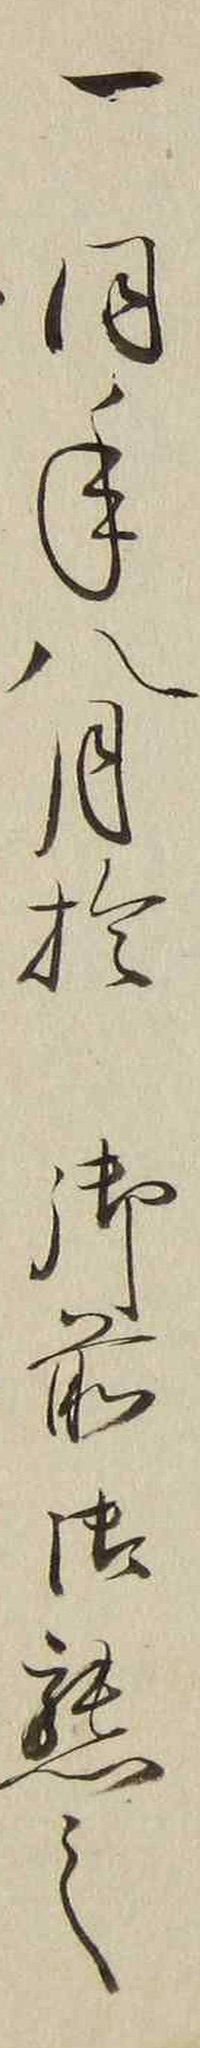一同年八月於御前御懇之
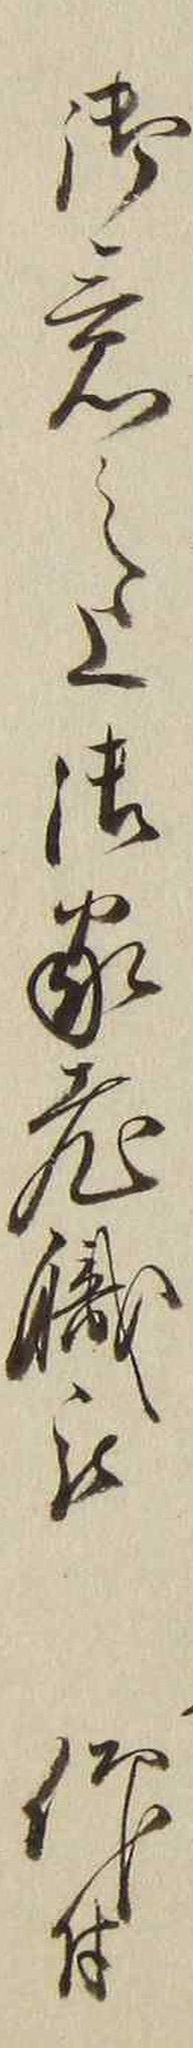御意之上御家老職被仰付
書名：諸士系譜　巻之103　か之部11
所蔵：会津若松市立会津図書館
